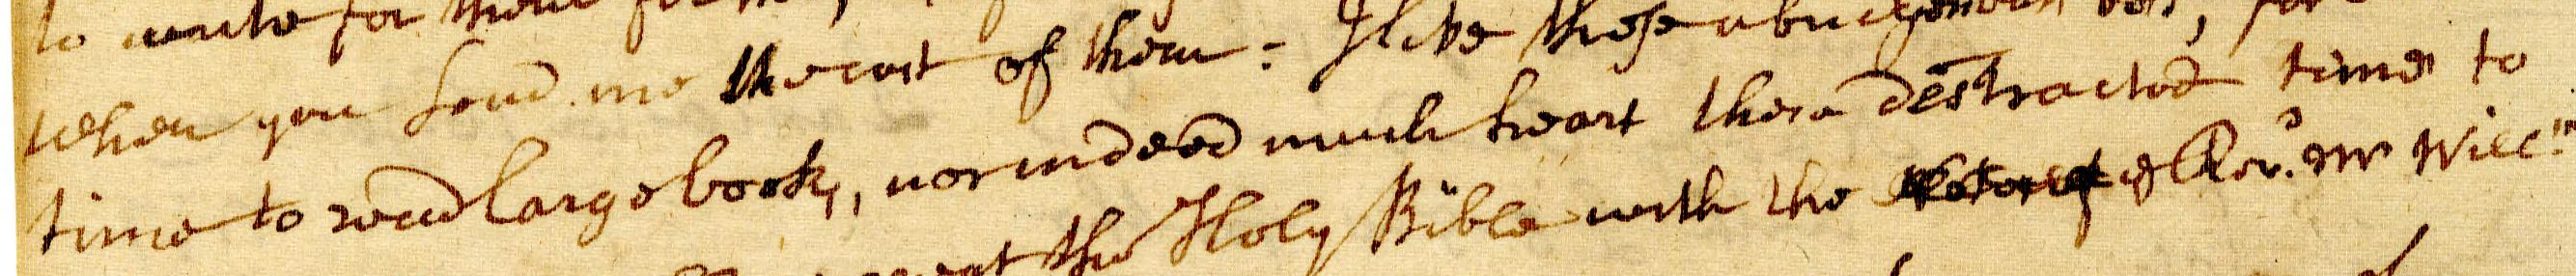time to read large books, nor indeed much heart these destracted times to
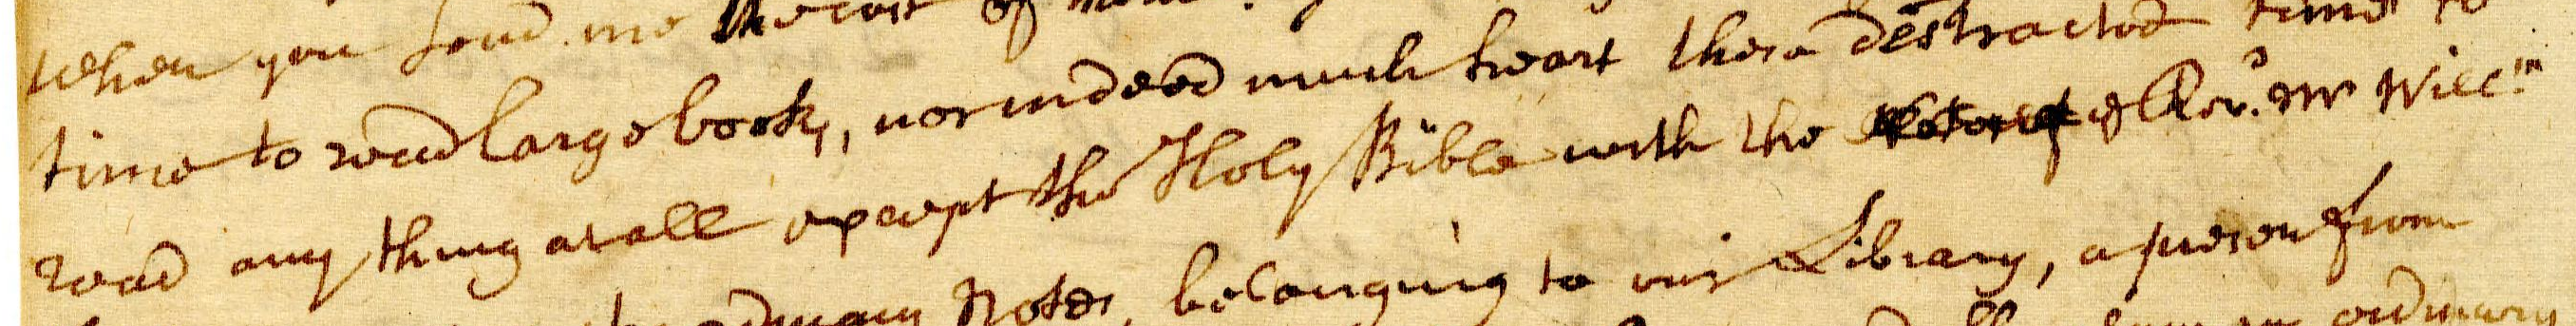read any thing at all except the Holy Bible with the [______] & Rev.^d M^r Will^m.
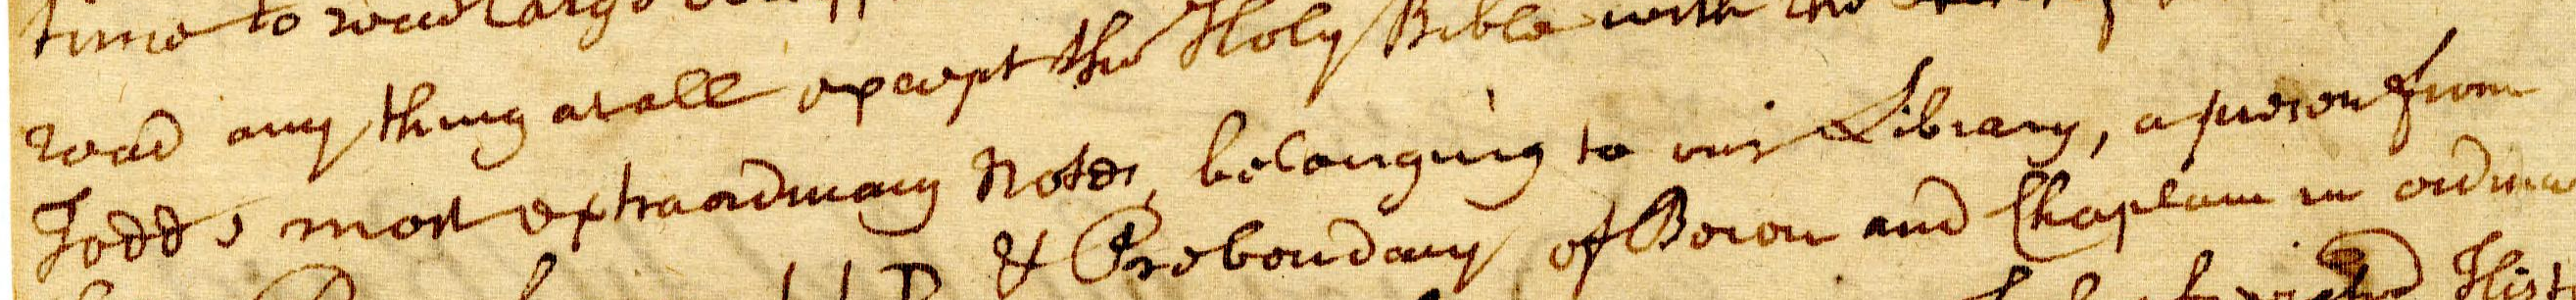Todds most extraordinary notes, belonging to our Library, a person from
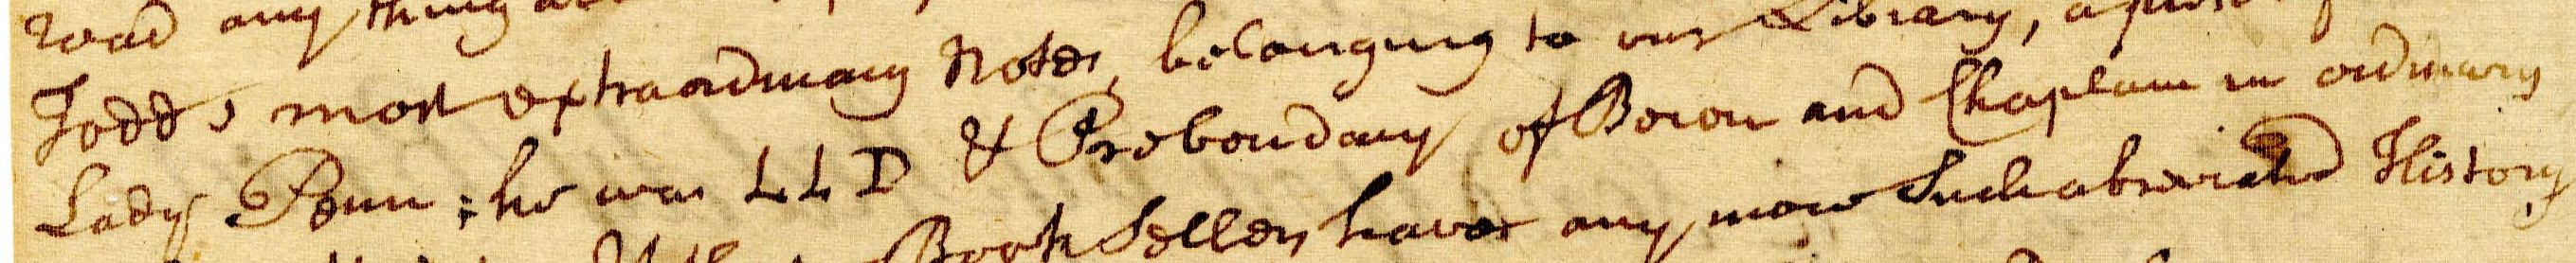Lady Penn; he was LLD & Prebondary of Baron and Chaplain in ordinary
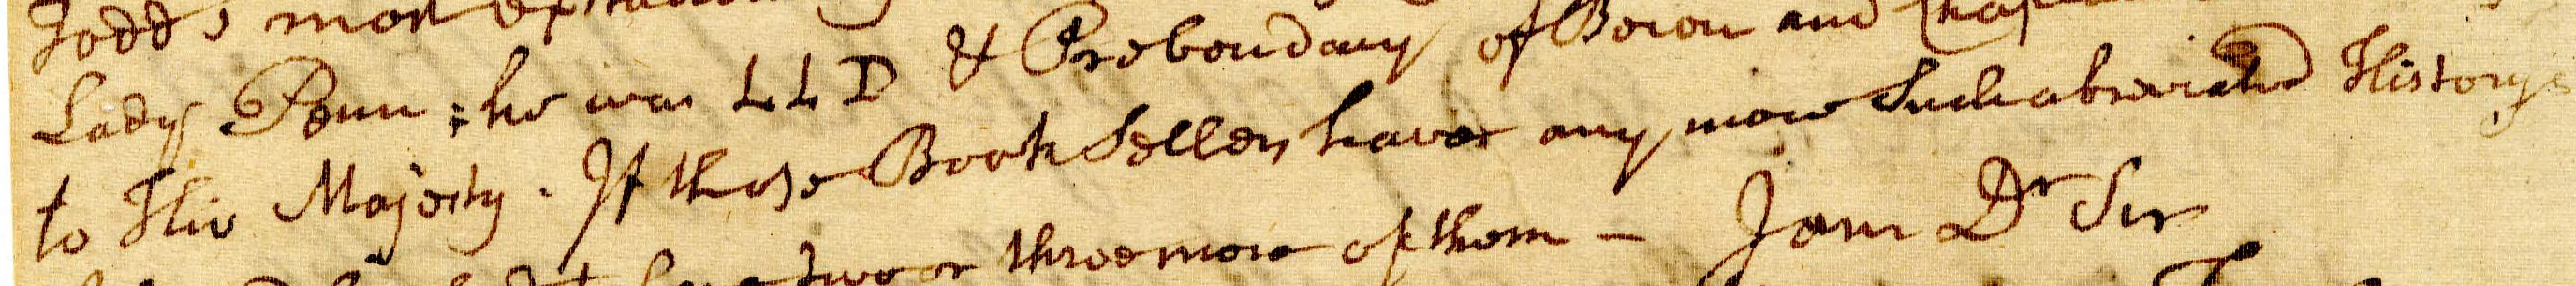to His Majesty. If these Book Sellers have any more such abridged History
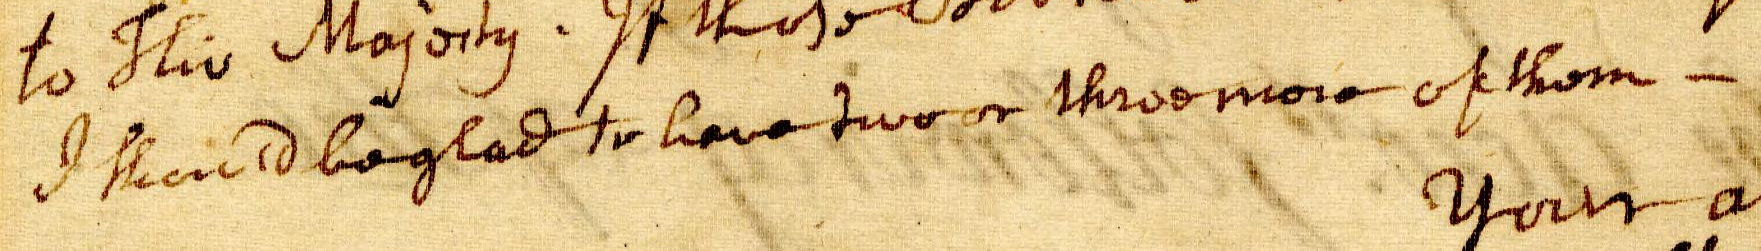I should be glad to have two or three more of them -
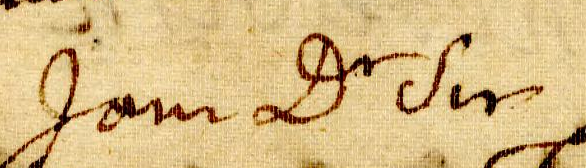I am D^r Sir
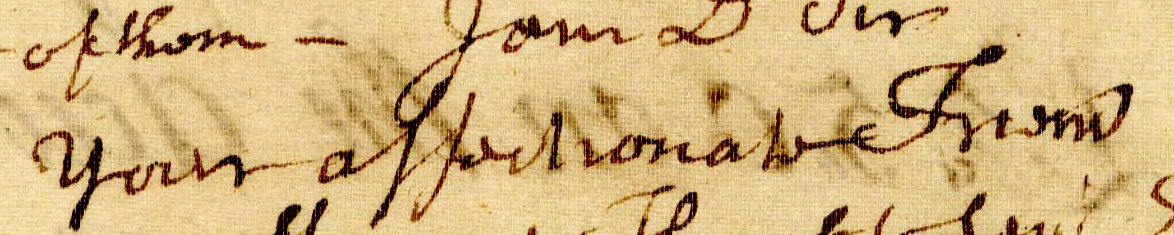Your affectionate Friend
